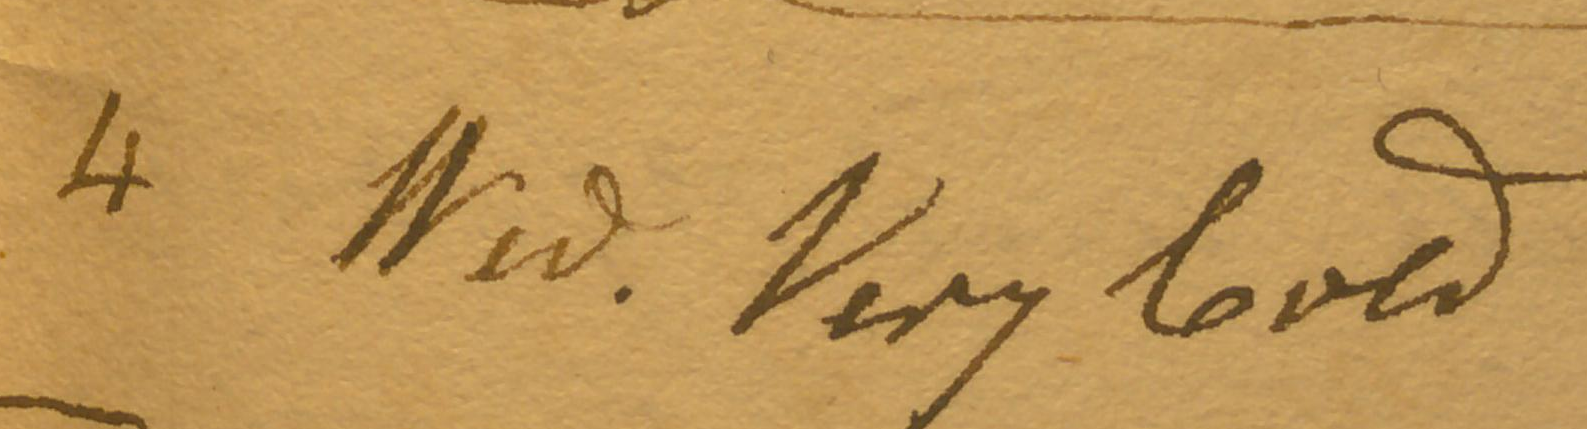4 Wed. Very Cold
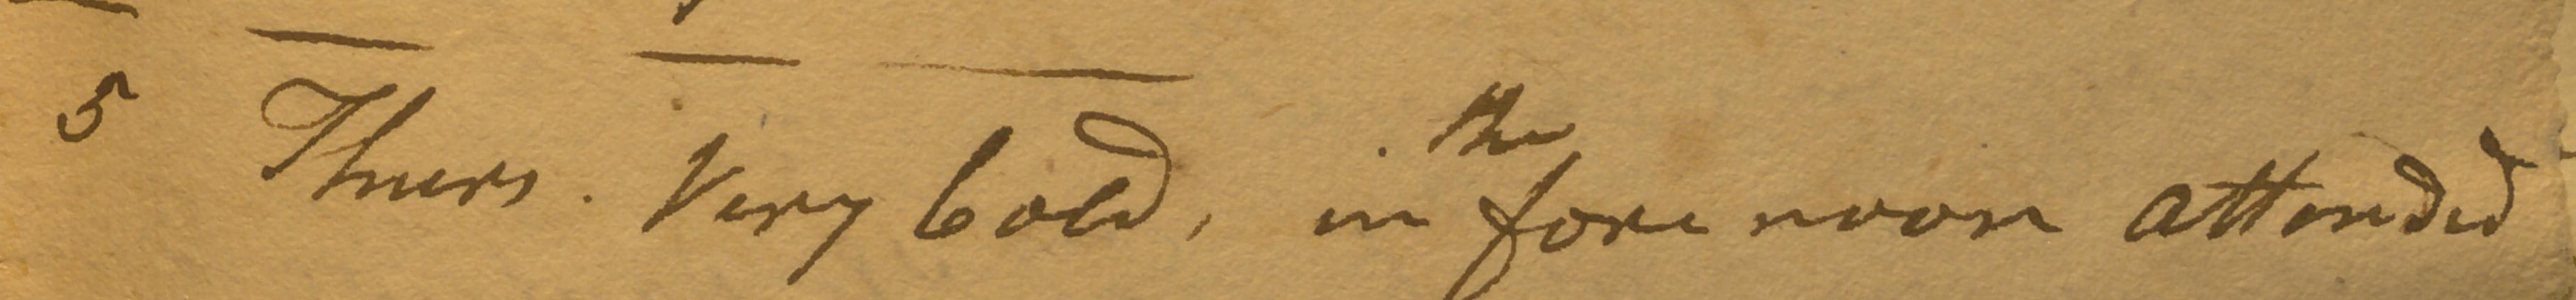5 Thurs. Very Cold, in forenoon attended
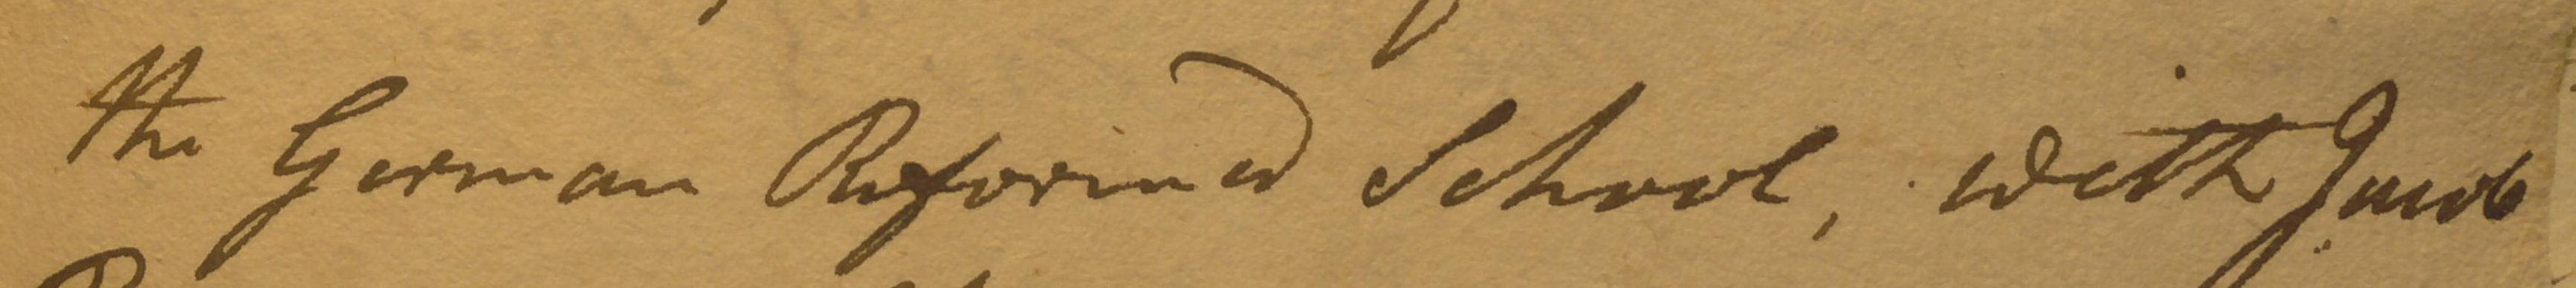the German Reformed School. with Jacob
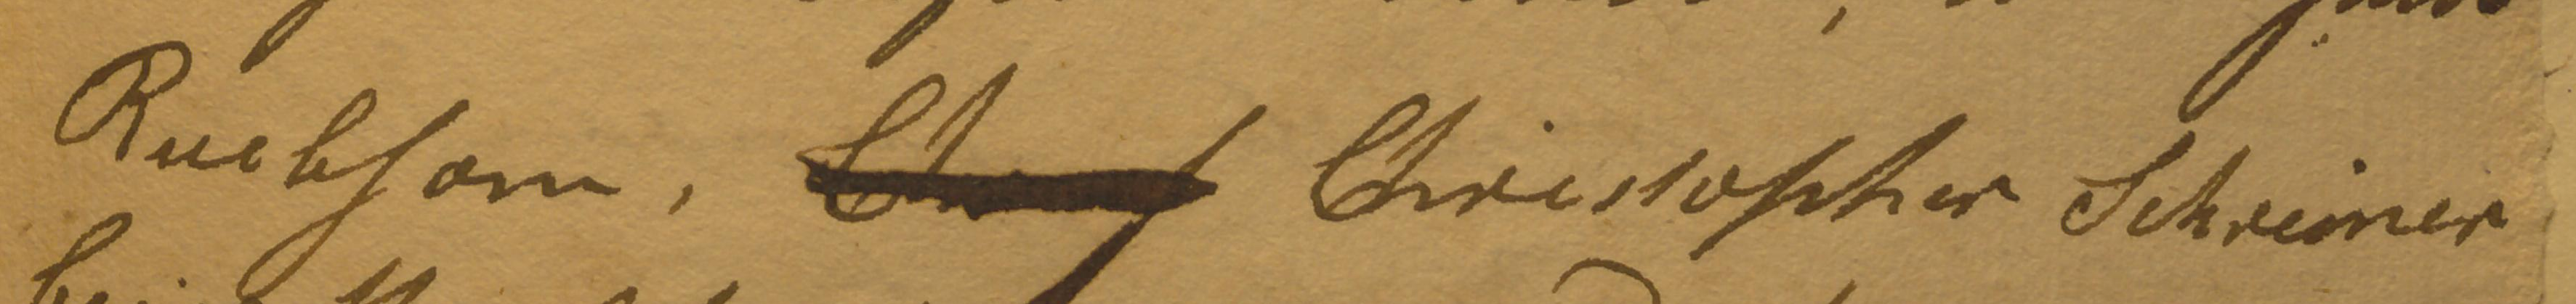Rucksome, [Chr] Christopher Schrimer
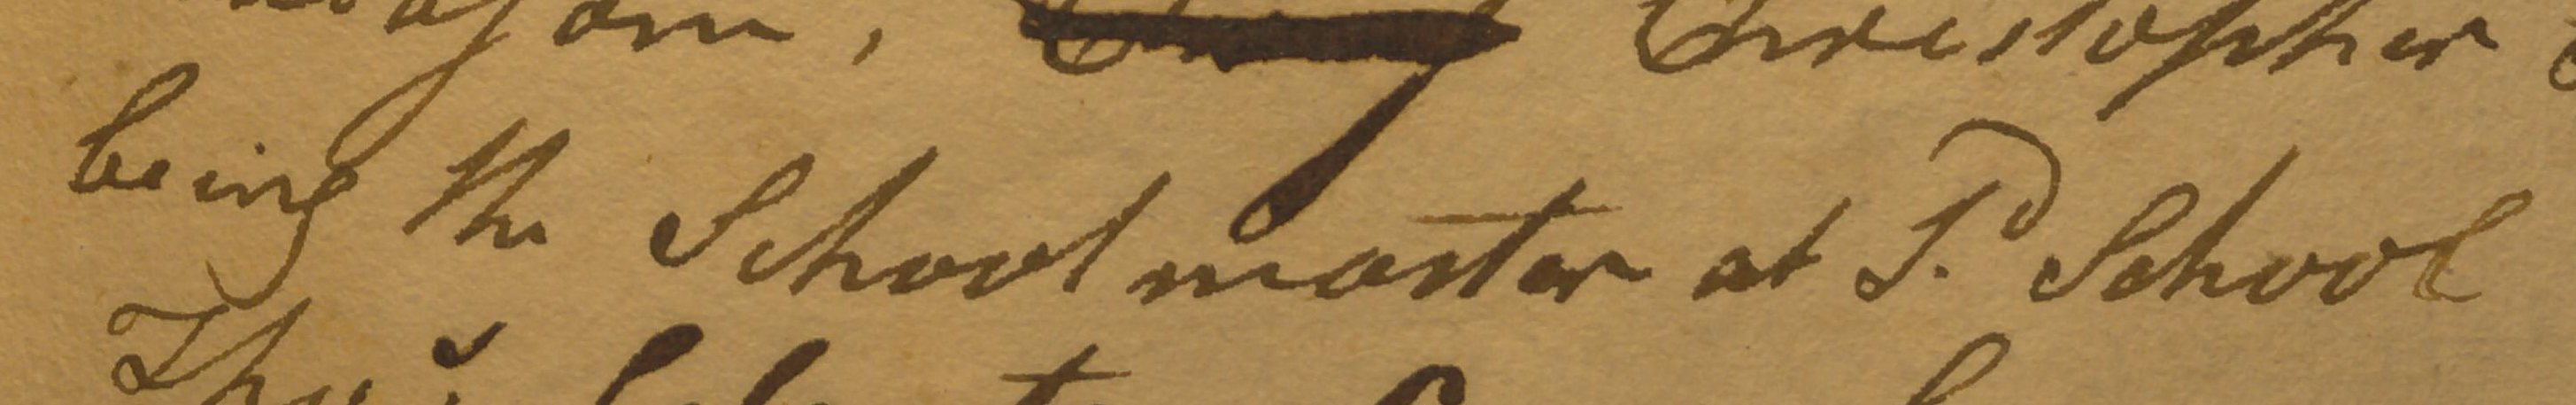being the School master at s^d. School
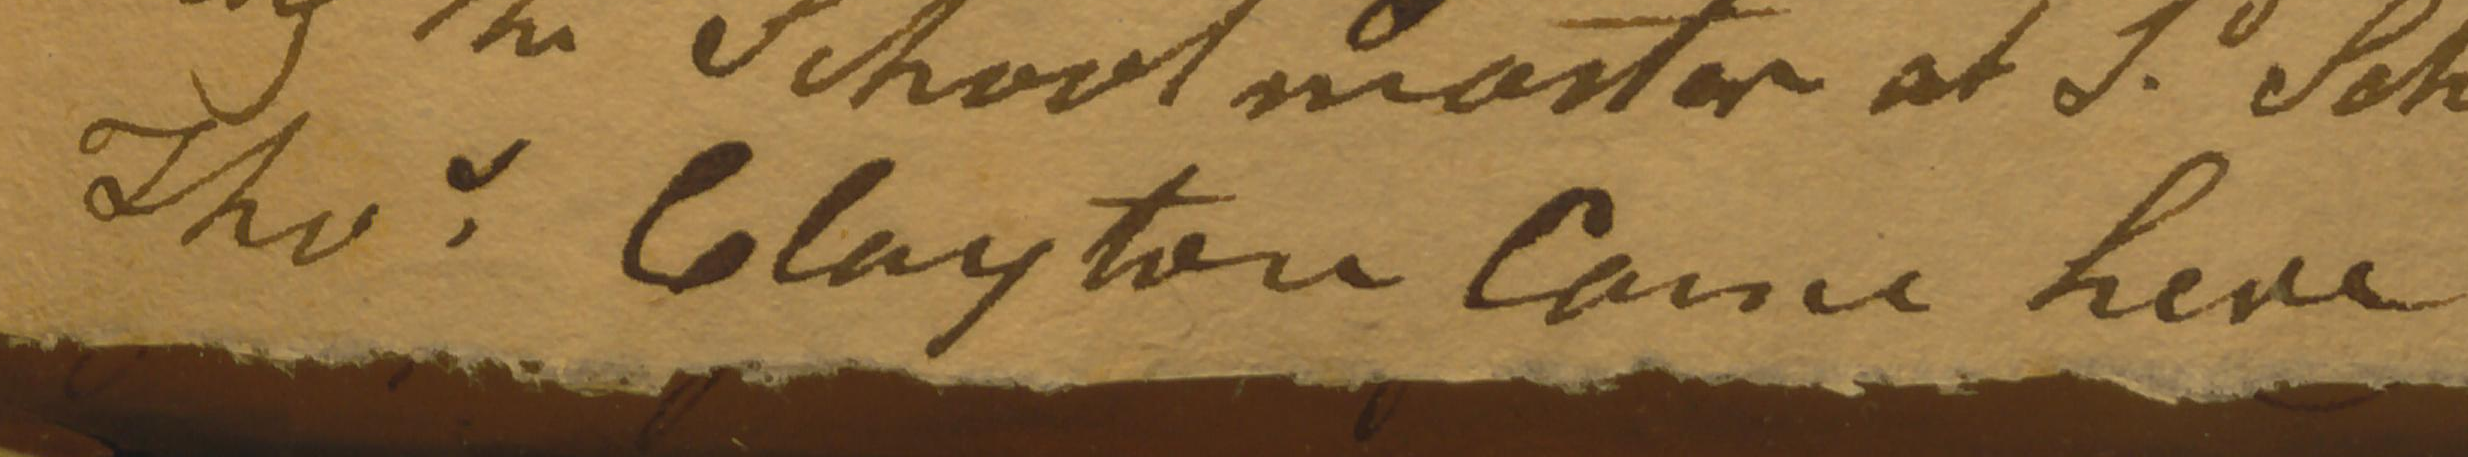Tho^s. Clayton Came here
